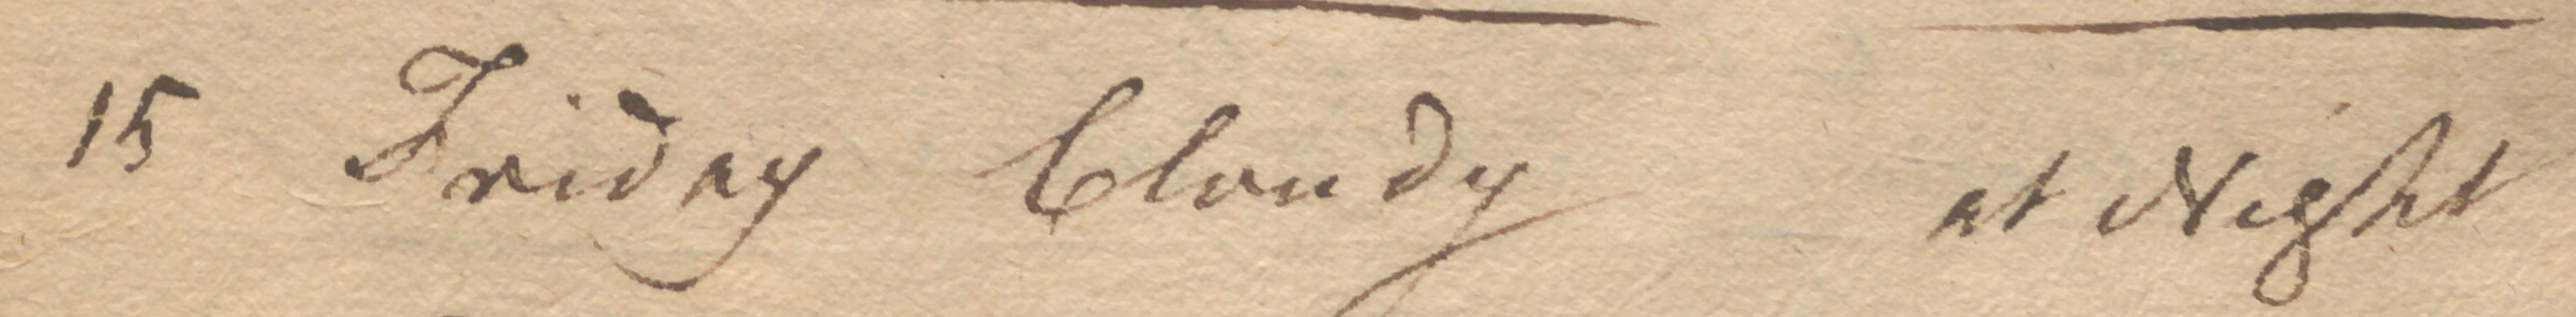15 Friday Cloudy at Night
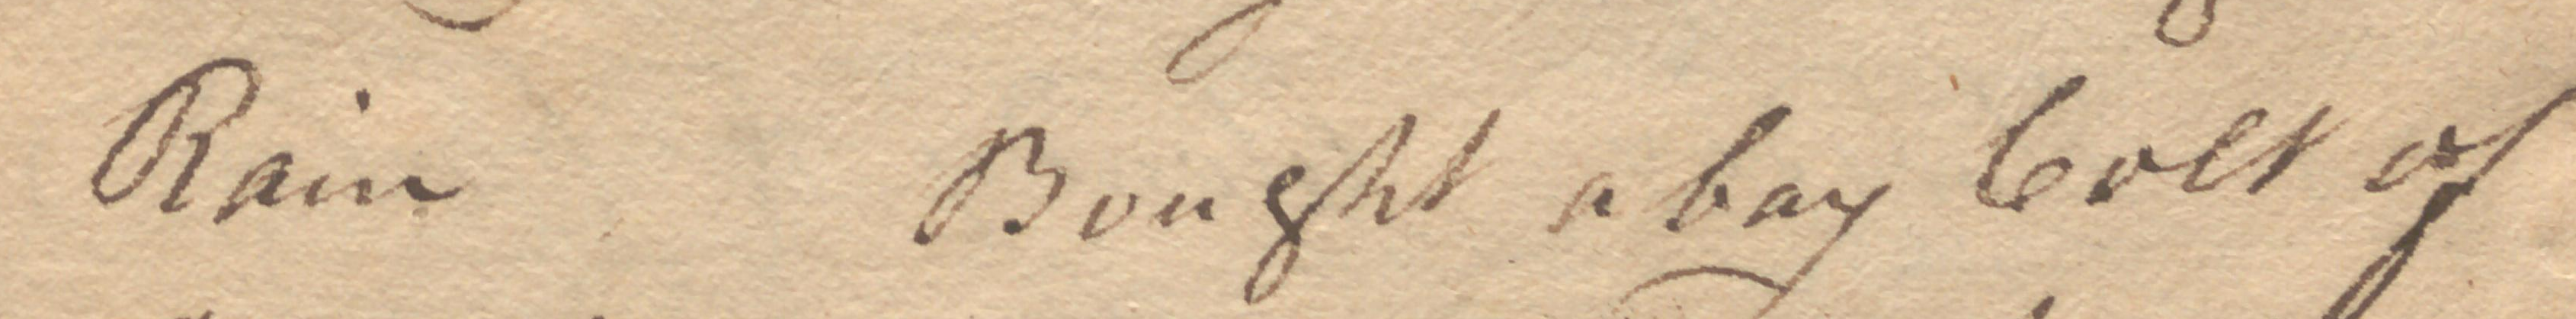Rain Bought a bay Colt of
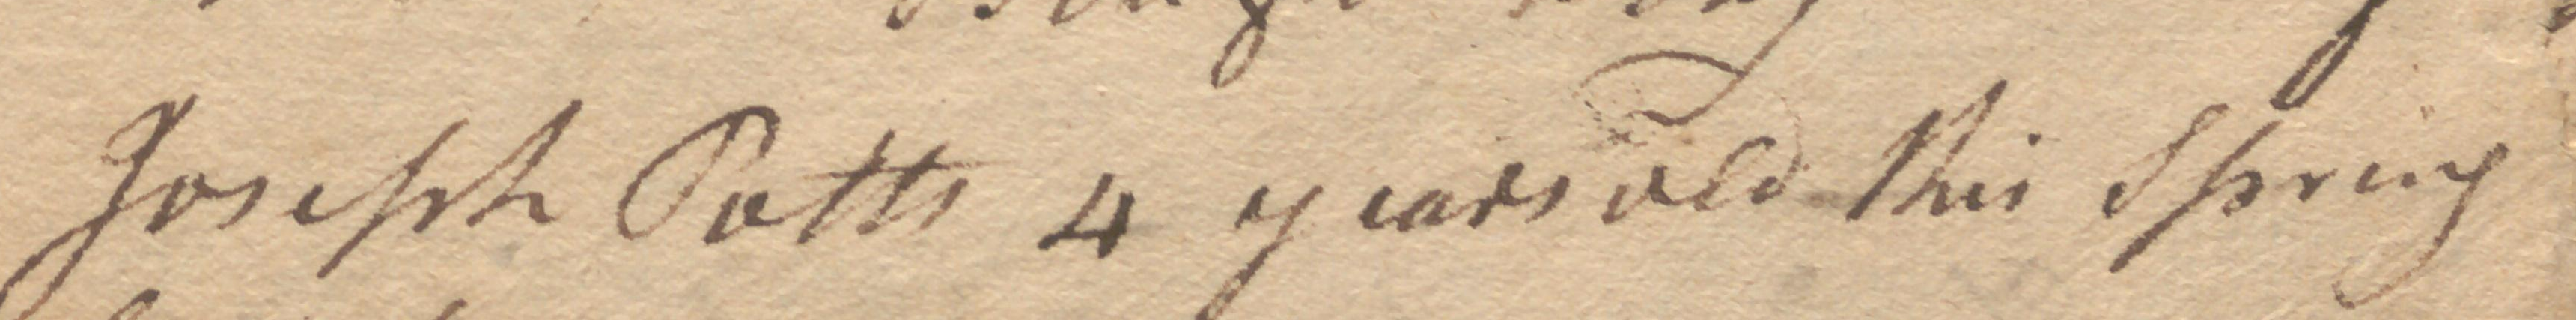Joseph Potts 4 years old this spring
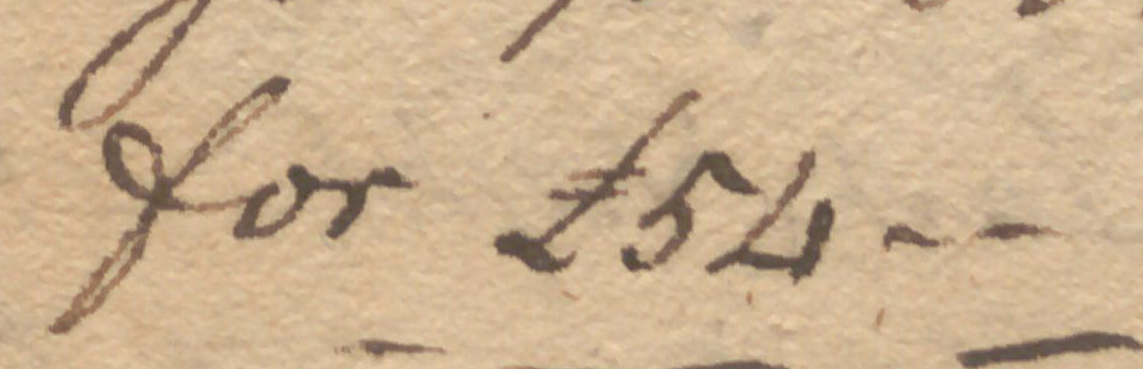for £54£
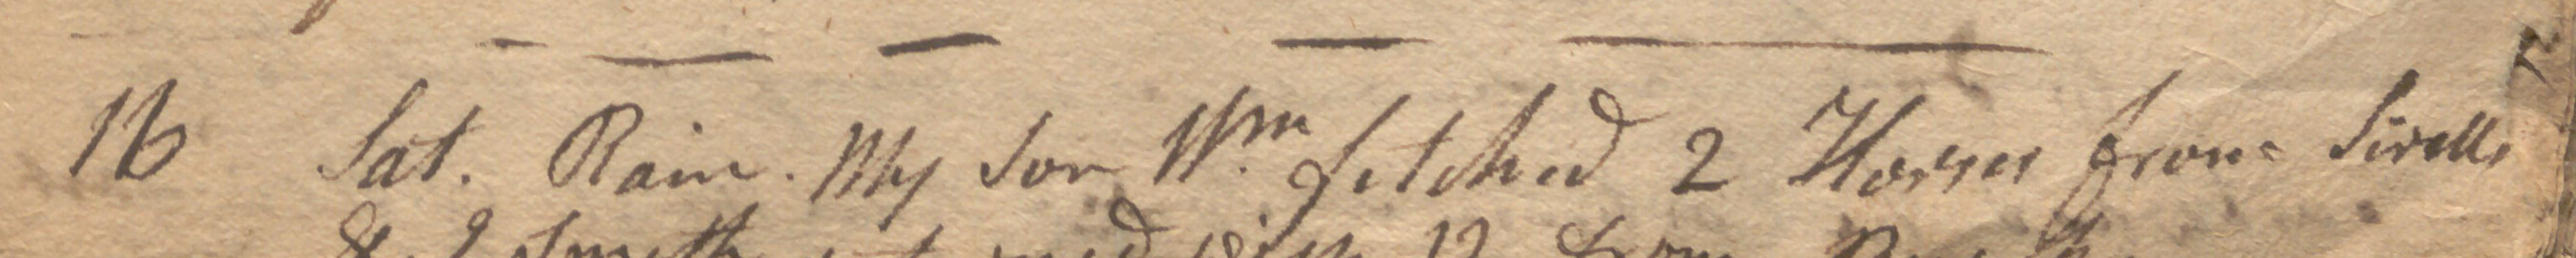16 Sat. Rain. My Son W^m. fetched 2 Horses from Sirells
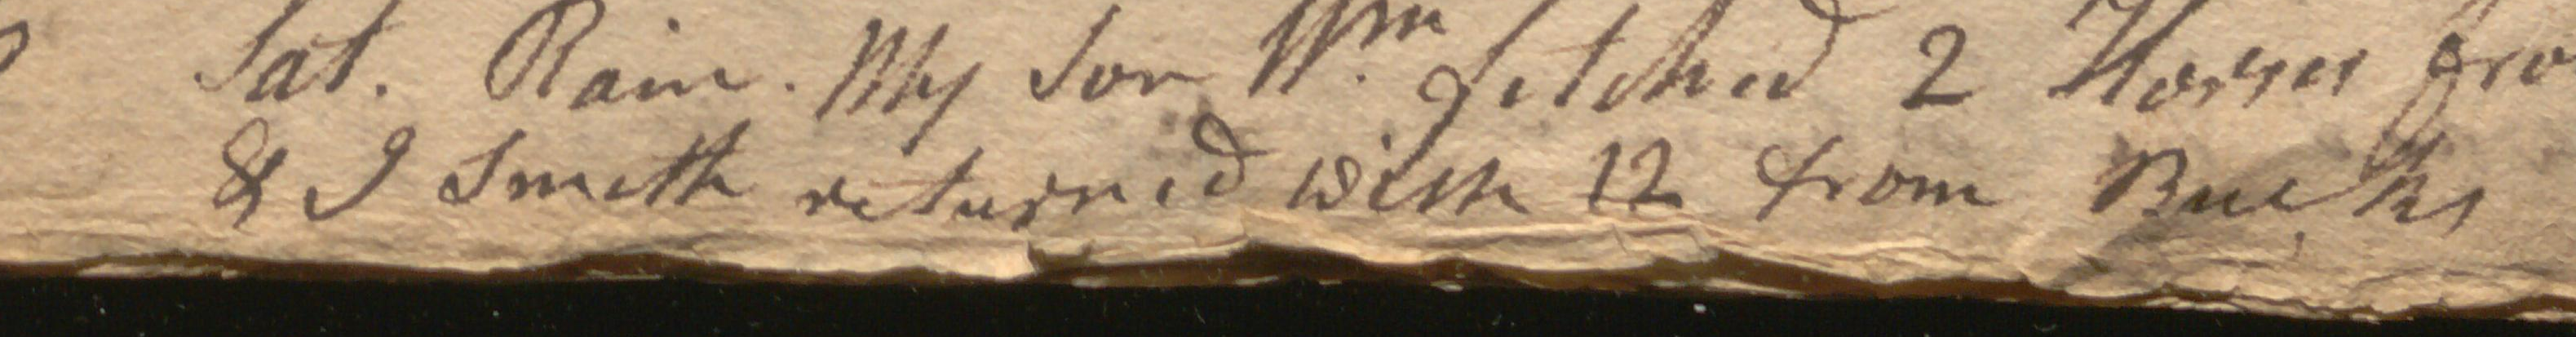& J Smith returned with &c from Bucks
